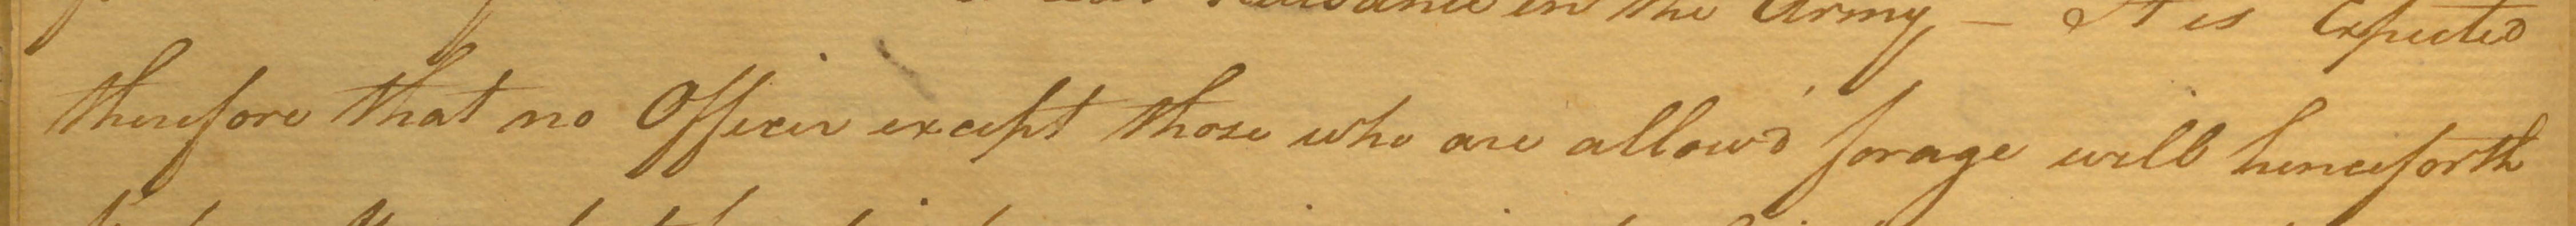therefore that no Officer expect those who are allow'd forage will henceforth
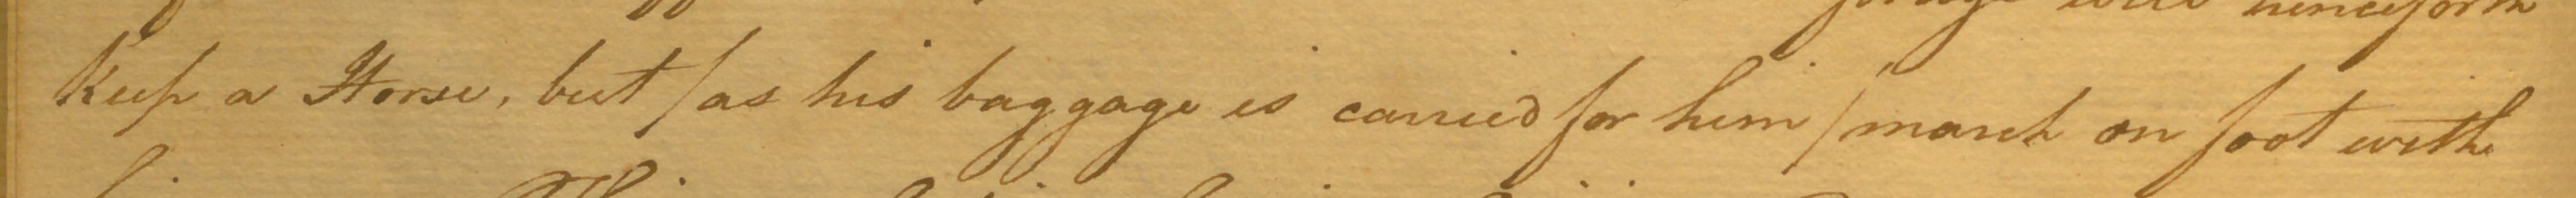keep a Horse, but /as his baggage is carried for him/ march on foot with
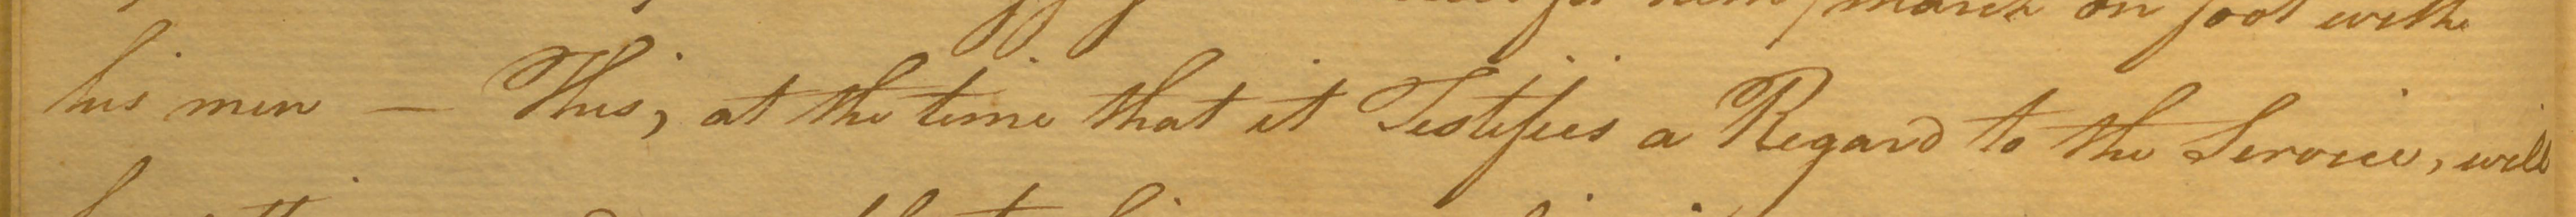his men- This, at the time that it Testifies a Regard to the Service, will
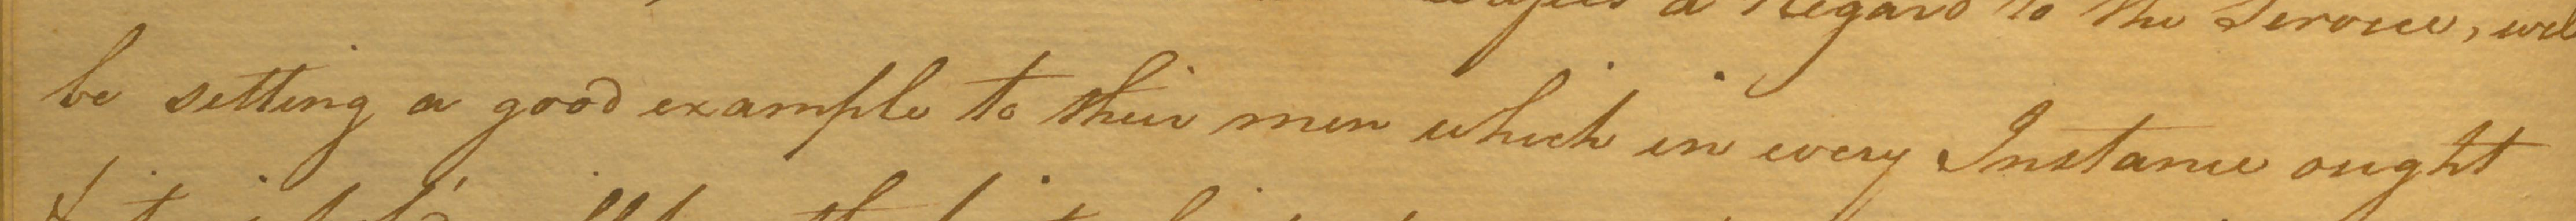be setting a good example to their men which in every Instance ought
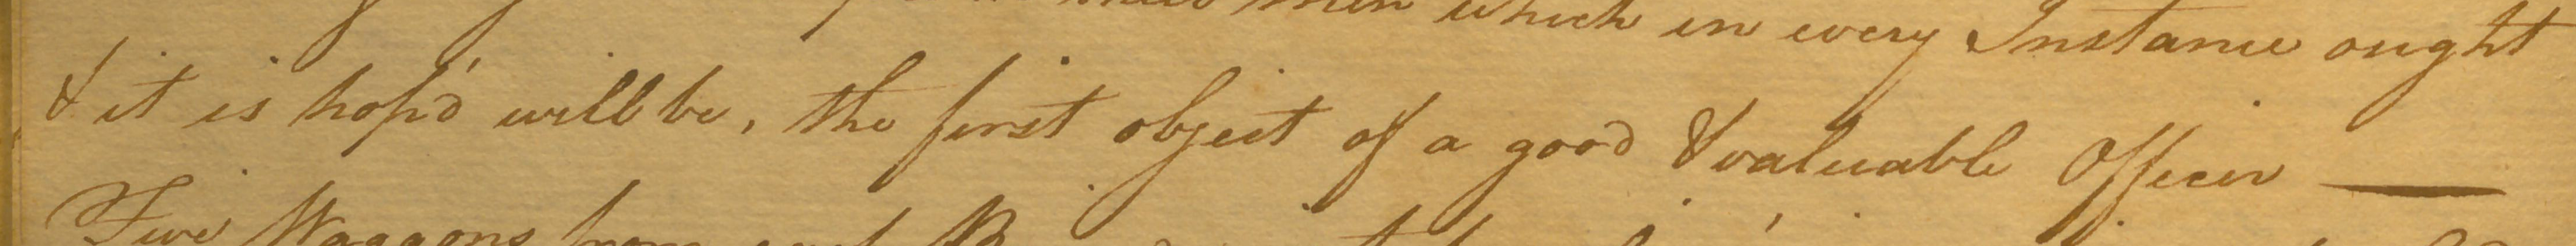& it is hop'd will be, the first object of a good & valuable Officer-
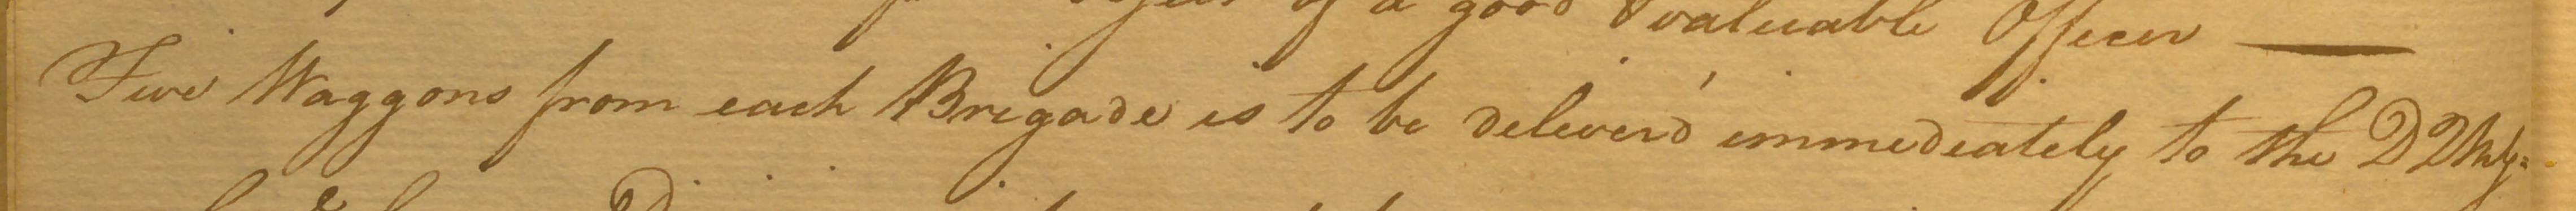Five Waggons from each Brigade is to be deliver'd immediately to the DQMG
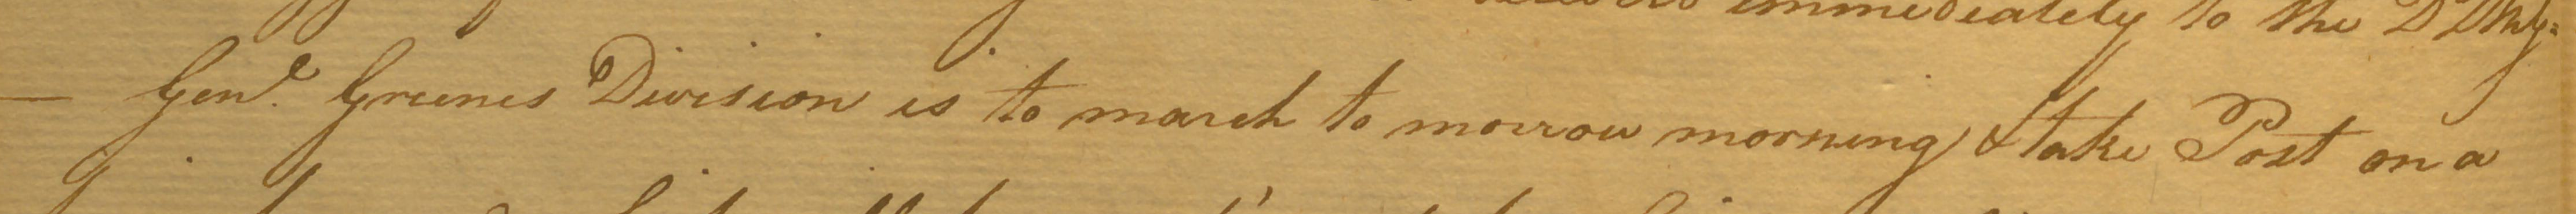- Gen^l. Greenes Division is to march to morrow morning & take Post on a
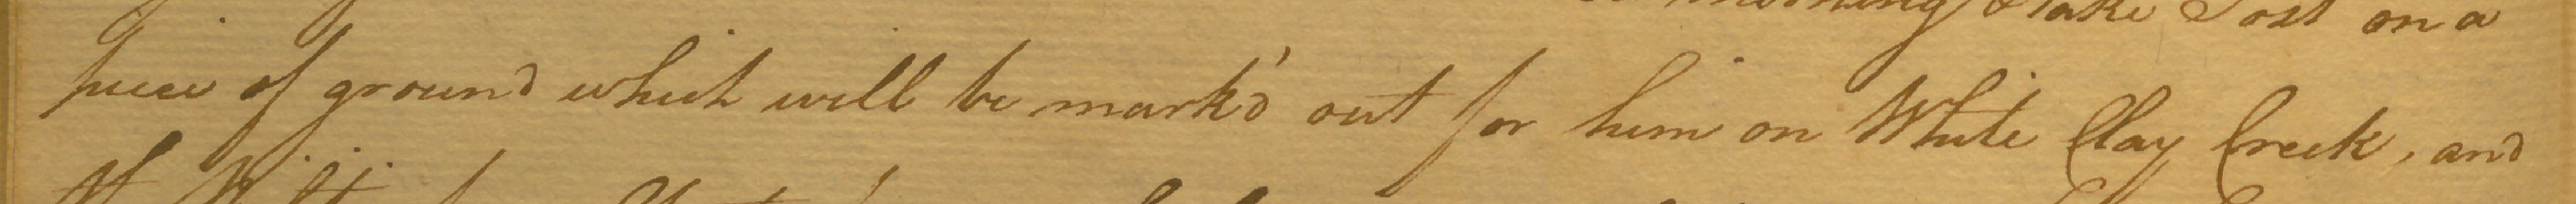piece of ground which will be mark'd out for him on White Clay Creek, and
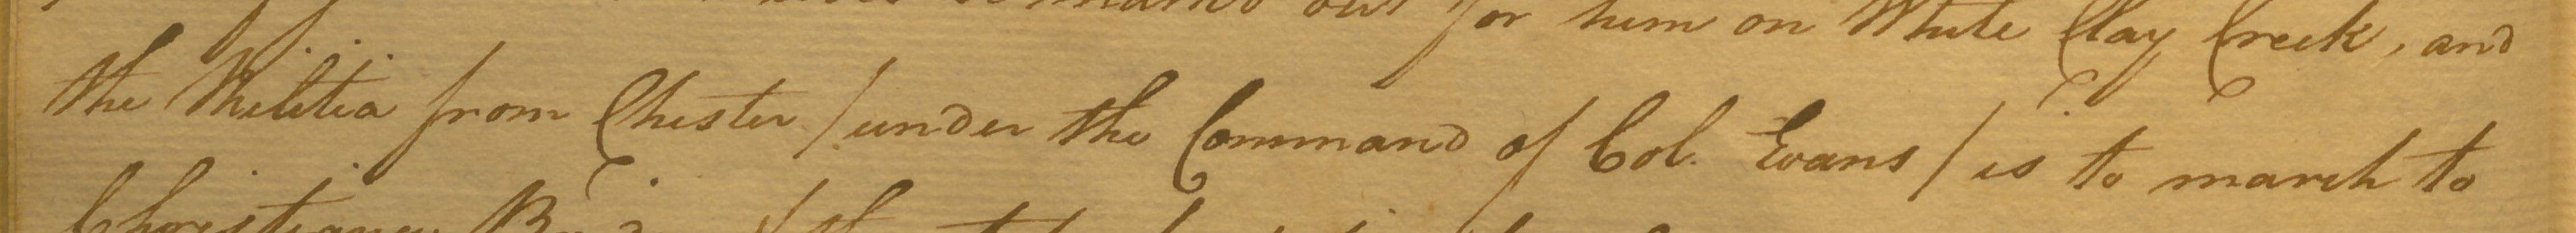the Militia from Chest /under the Command of Col. Evans/ is to march to
